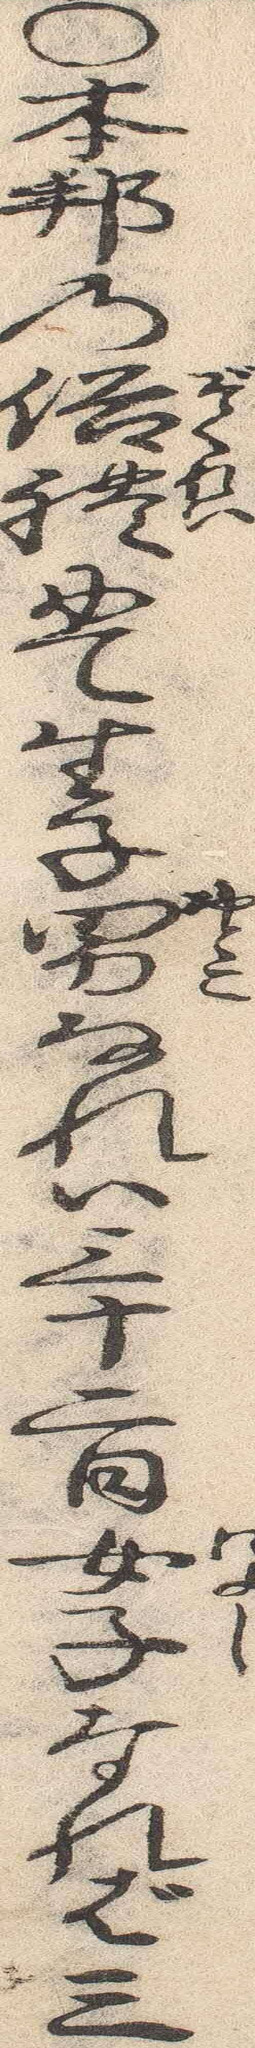◯本邦の俗禮にて生子男なれは三十二日女子なれば三
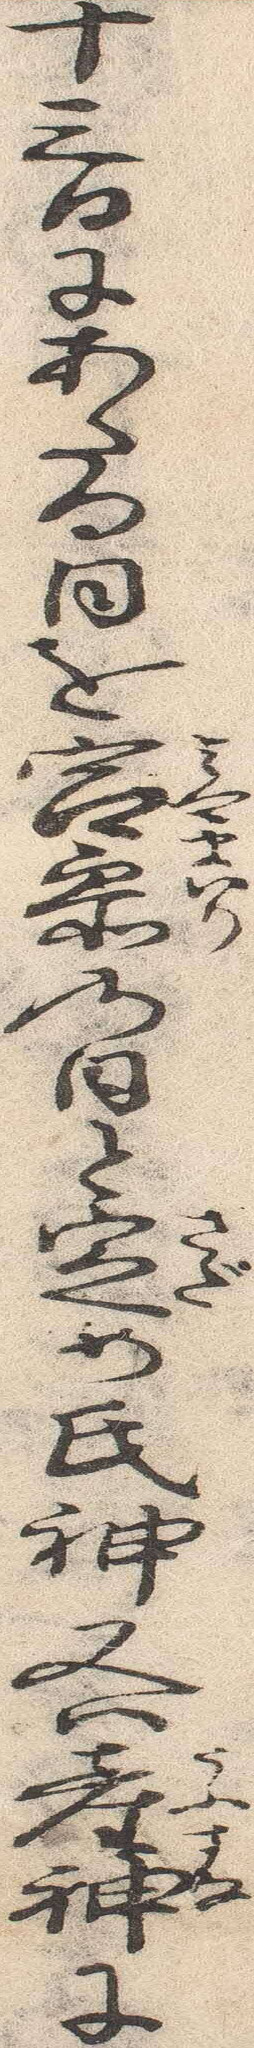十三日にあたる日を宮參の日と定め氏神又は産神に
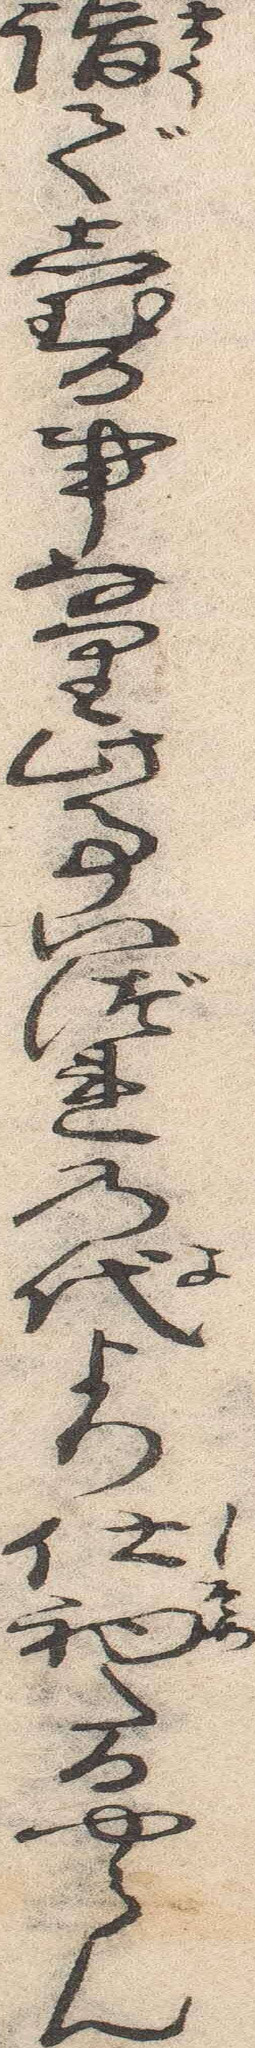詣でしむる事なり此事いづれの代より仕初たるやらん
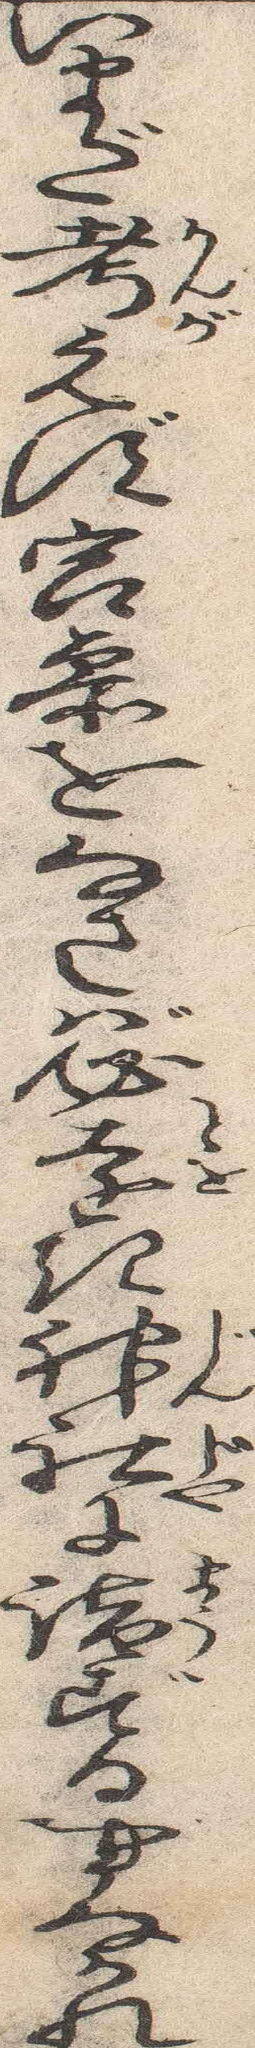いまだ考えず宮參をなさば必遠き神社に詣ずる事なかれ
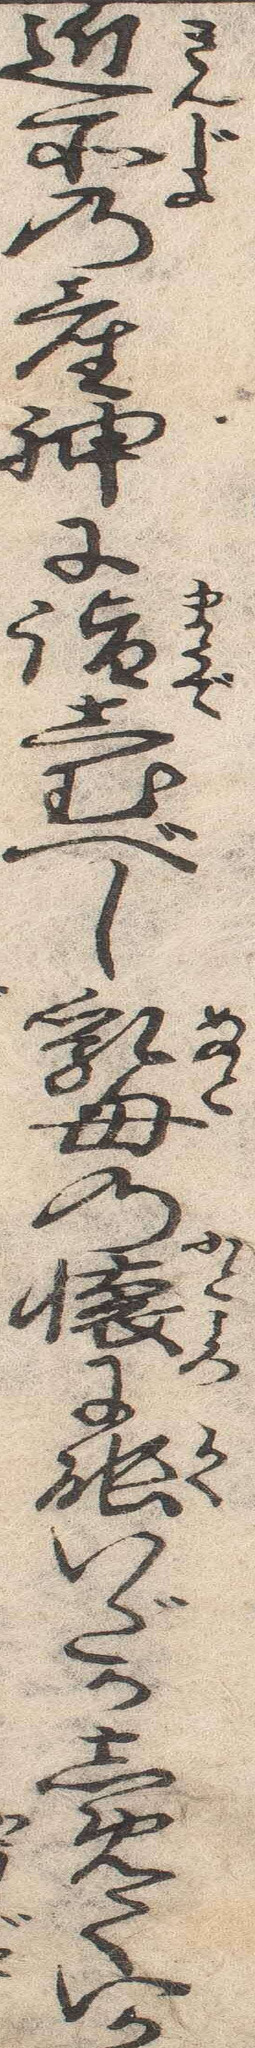近所の産神に詣しむべし乳母の懐に能いだかしめていか
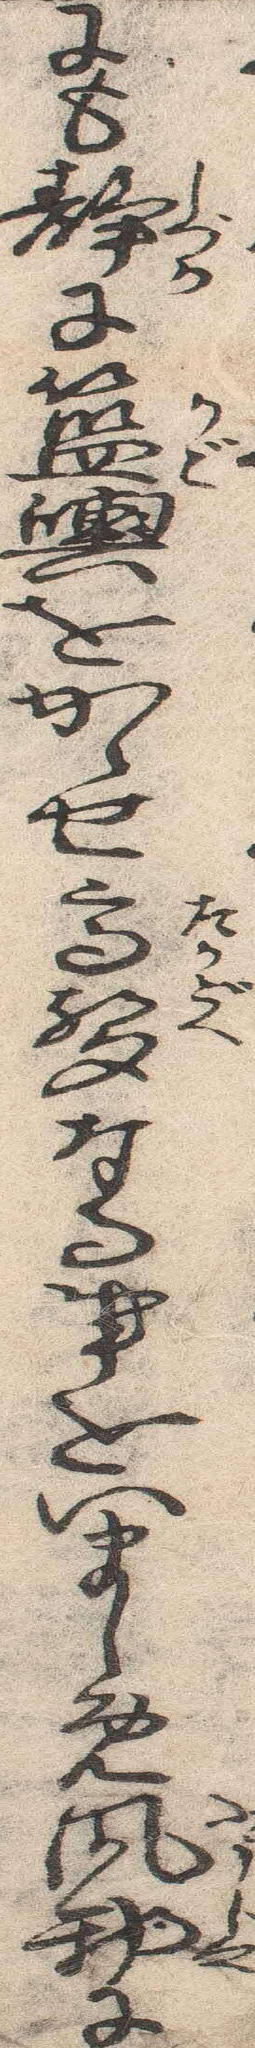にも静に籃輿をかゝせ高聲なる事をいましめ風邪に
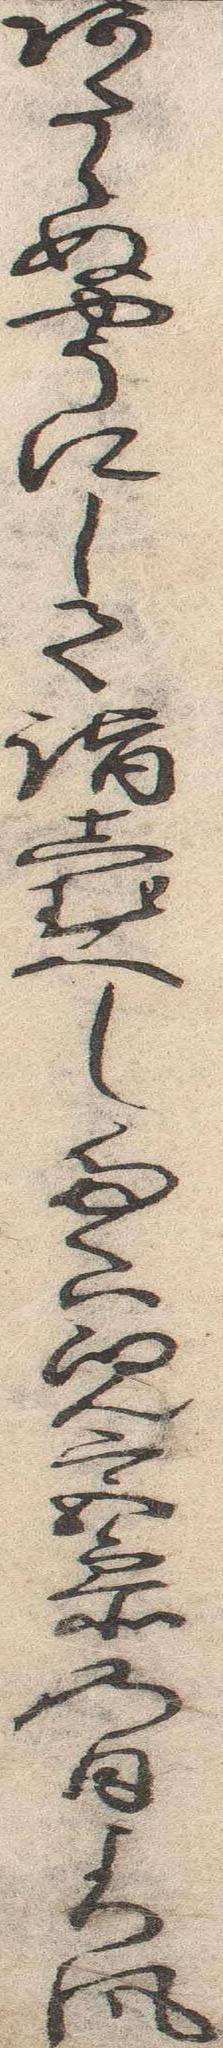あたらぬやうにして詣しむへし多くは児宮參の日より風
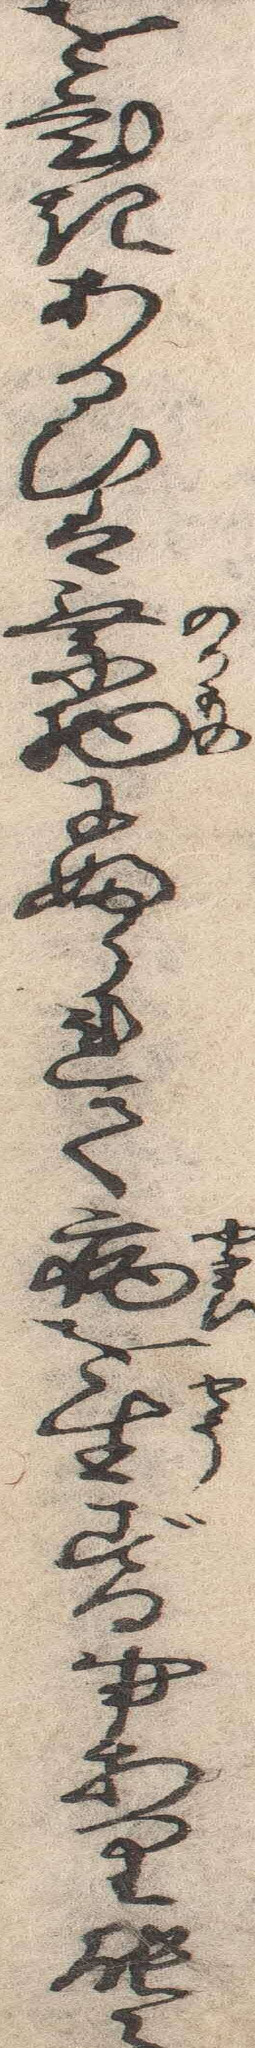をひきあるひは乘物にふられて病を生ずる事あり能〻
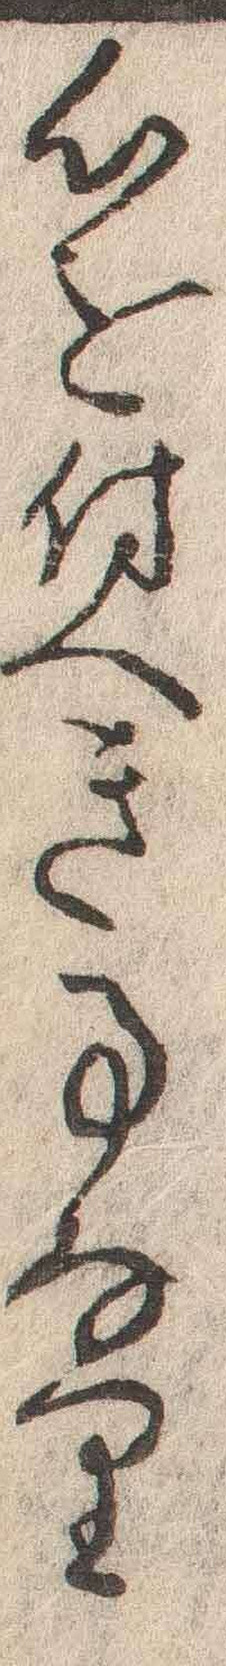心を付へき事なり

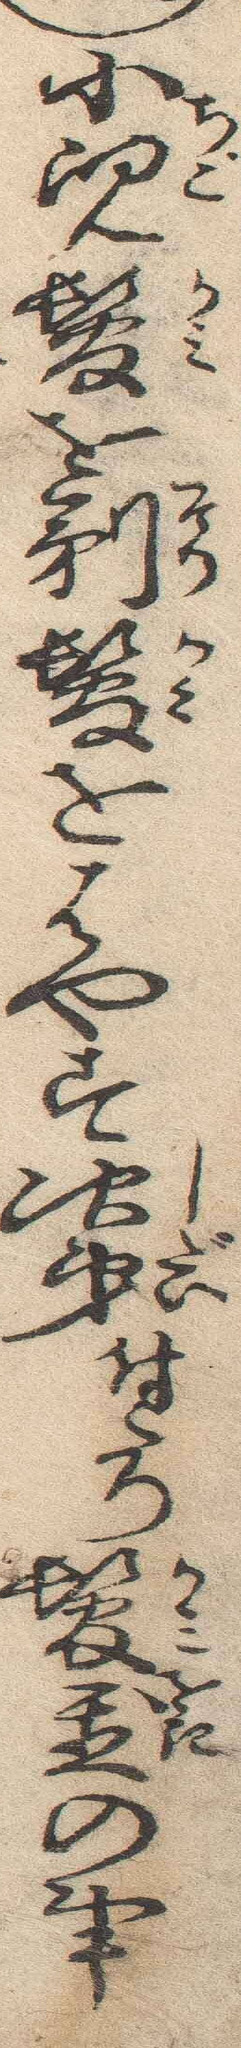㊂小児髪を剃髪をはやす次第付たり髪置の事
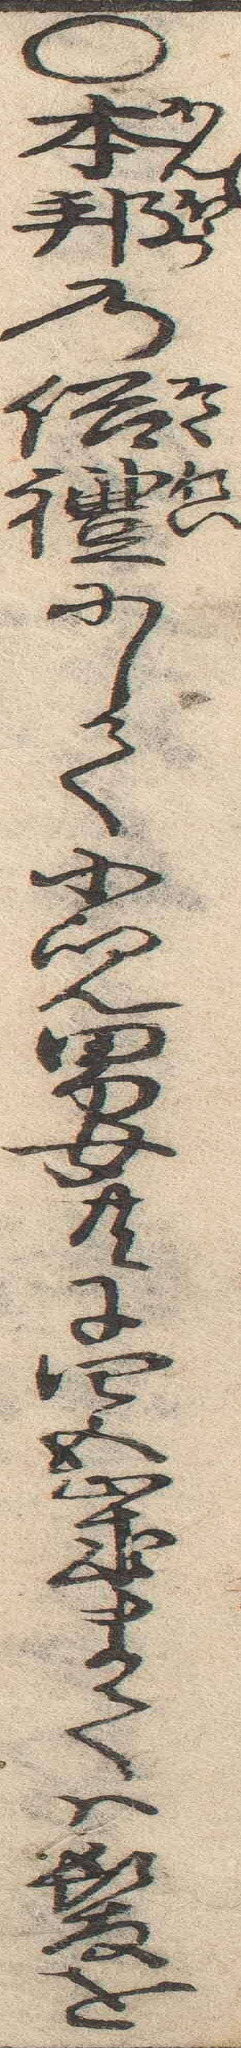◯本邦の俗禮にして小児男女共に四五歳まては髪を
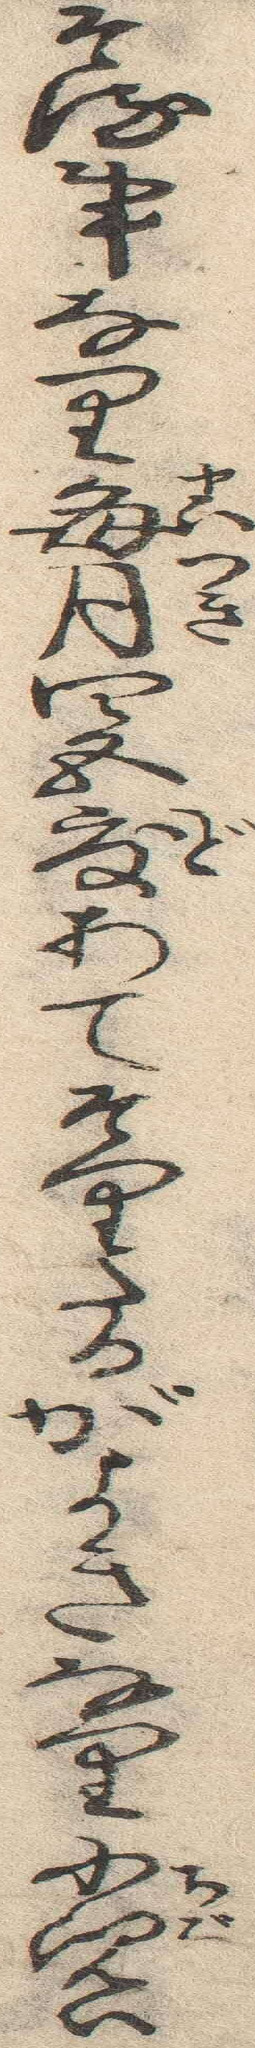そる事なり毎月四五度あてそりたるがよきなり小児は
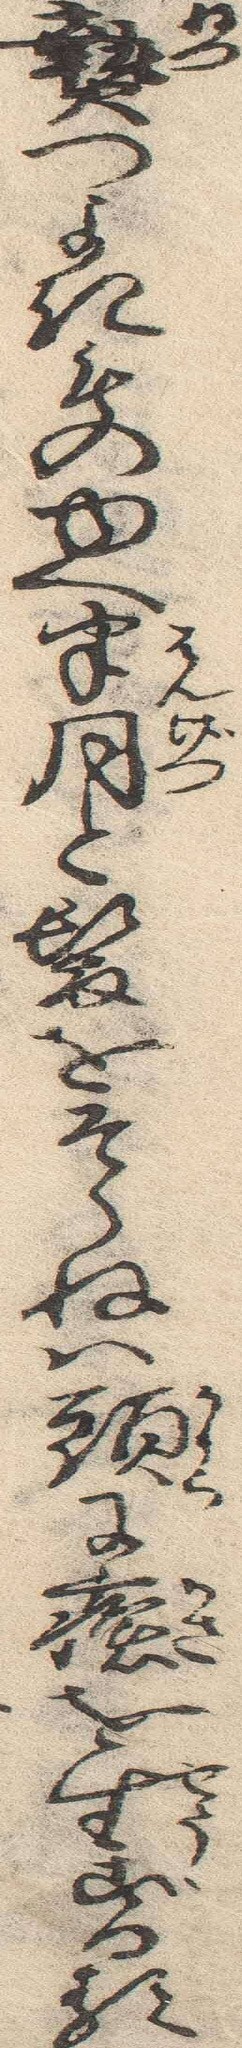𤍽つよきものゆへ半月と髪をそらねは頭に瘡を生ずる類
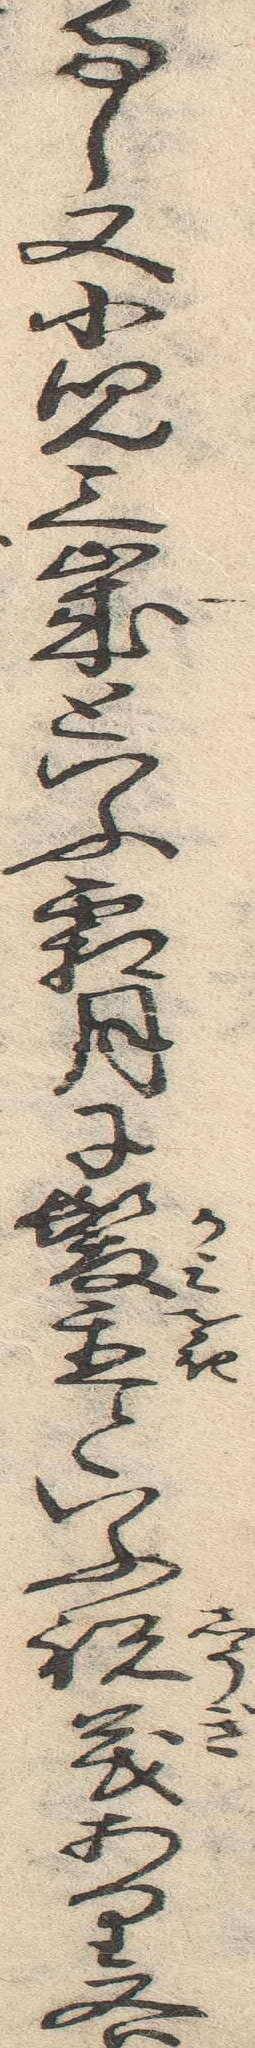多し又小児三四歳といふ霜月に髪置といふ祝義あり又は
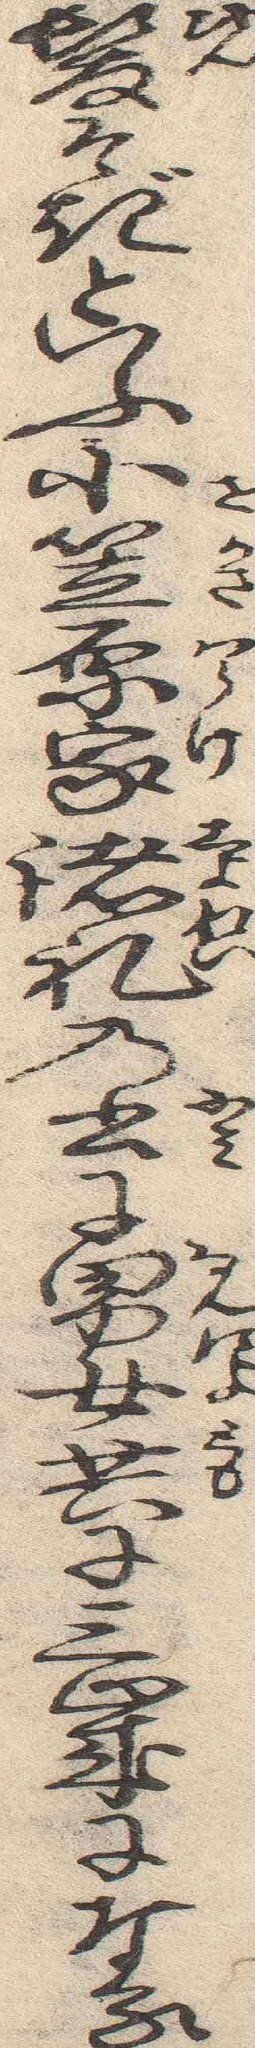髪そぎといふ小笠原家諸礼の書に男女共に三四歳になる
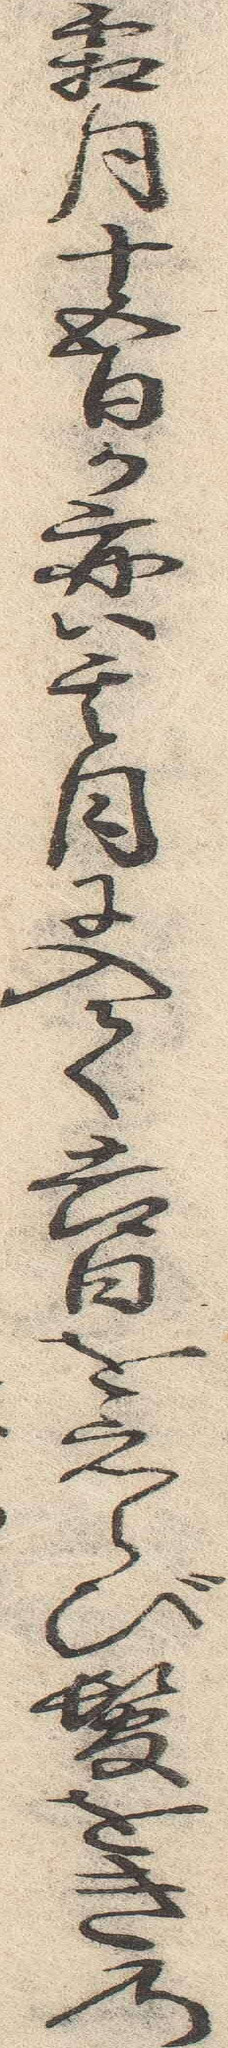霜月十五日か亦は其月に入て吉日をえらび髪をきの
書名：小児必用養育草
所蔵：東京学芸大学附属図書館 国文学研究資料館
